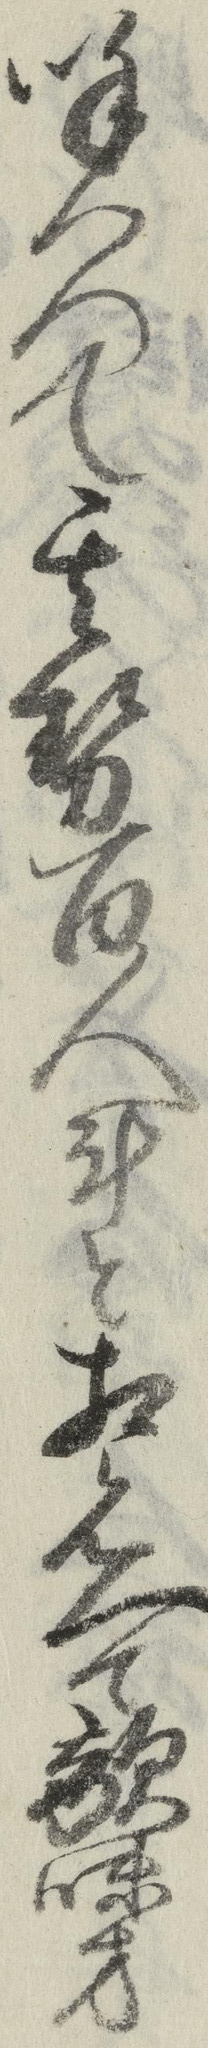呼はつて其勢百人計と相見へて敵味方
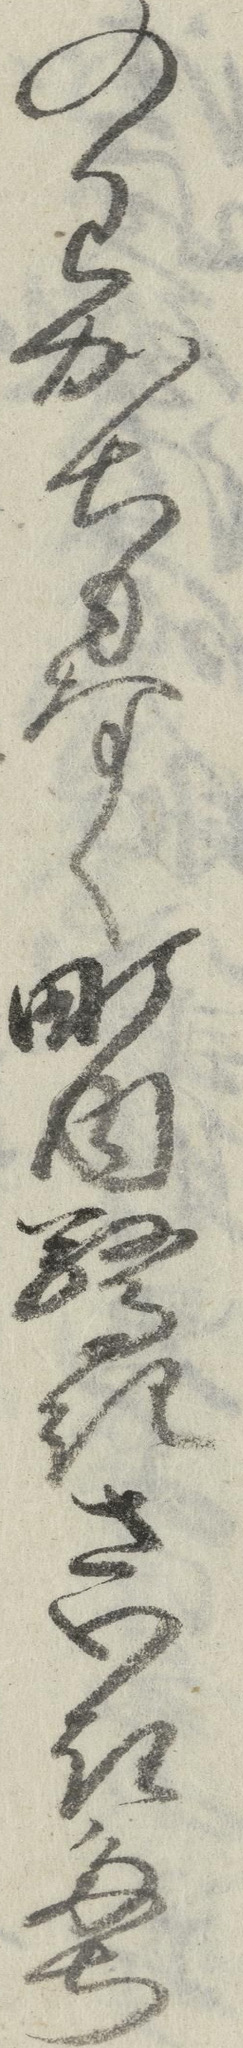のわかちもなく町内驚きさわきたち
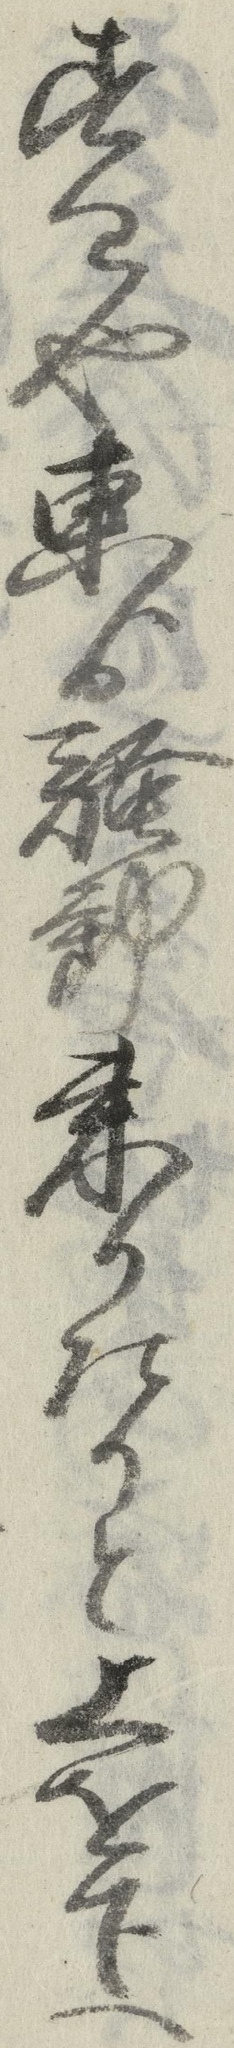すわや東ゟ騒動来りたりと上を下へ
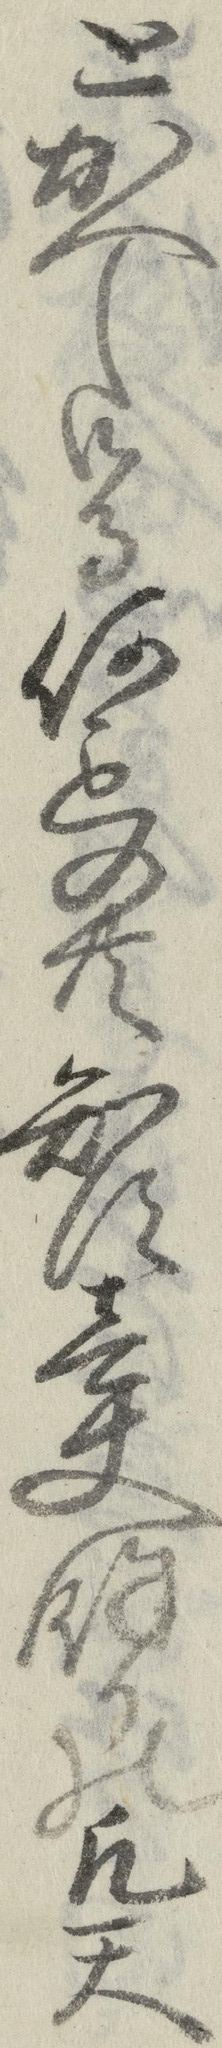とかへしける何もの共知す壱丈餘りの凡天
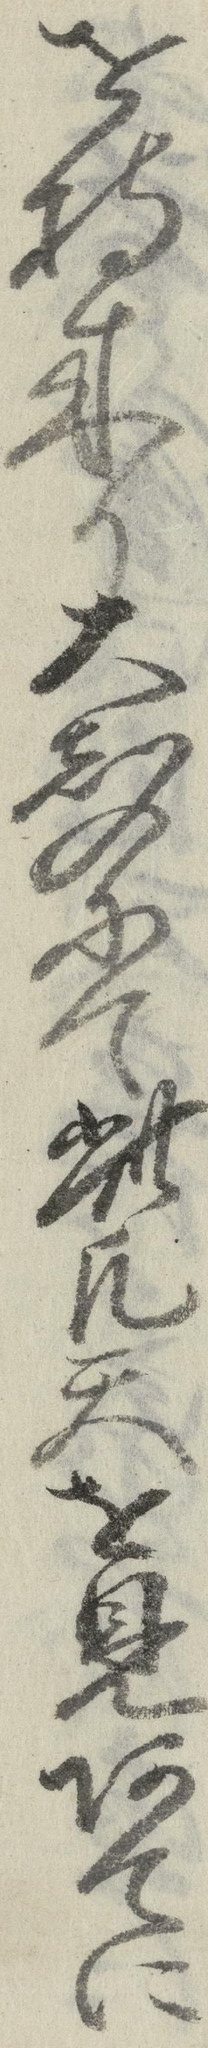を持来り大勢にて此凡天を見あてに

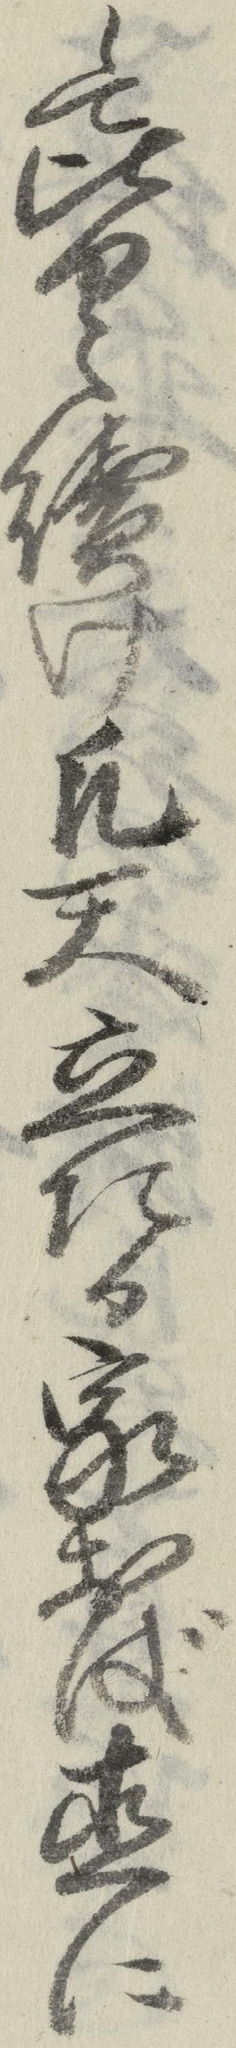して皆々続け凡天立たる家おば直に
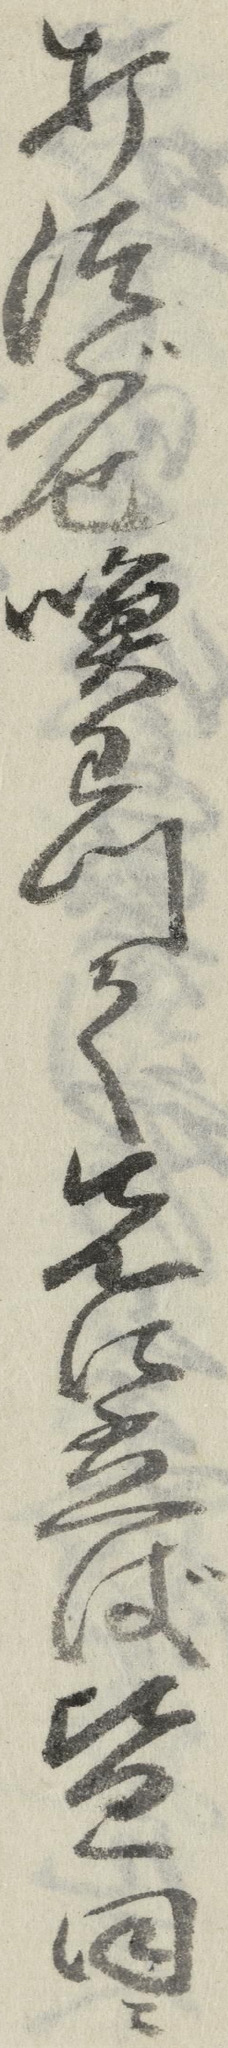打つぶせ喚わつて先に立ば皆一同に
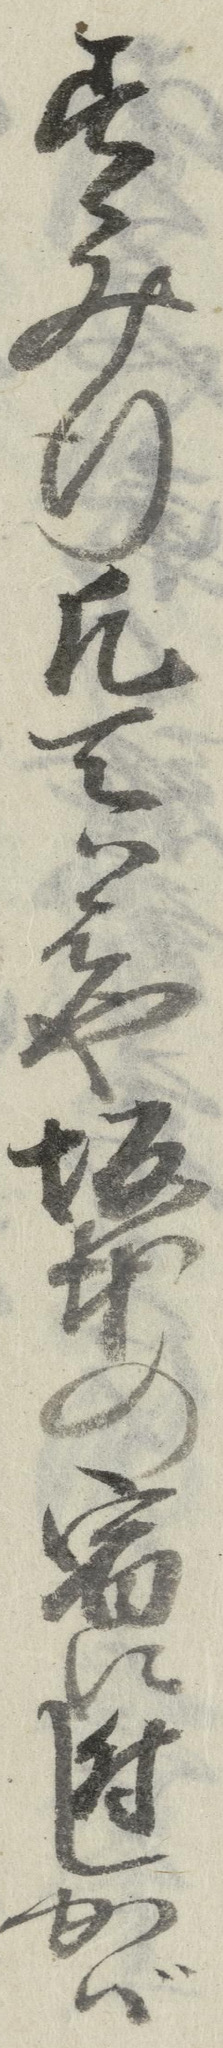すゝみ行凡天若や坂本の宿に付しかば
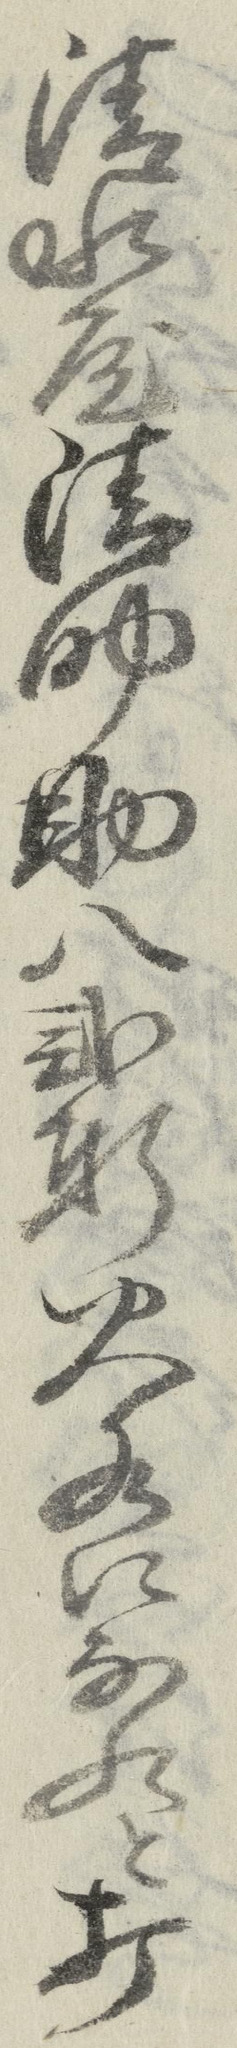清水屋清助助八弐軒火水になれと打
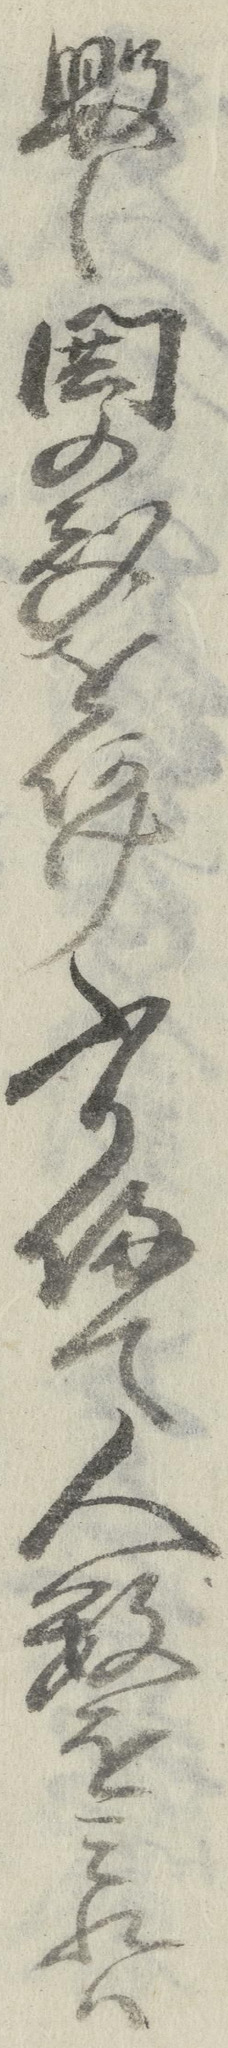毀し閧の勢をあけふり帰て人数をみれは
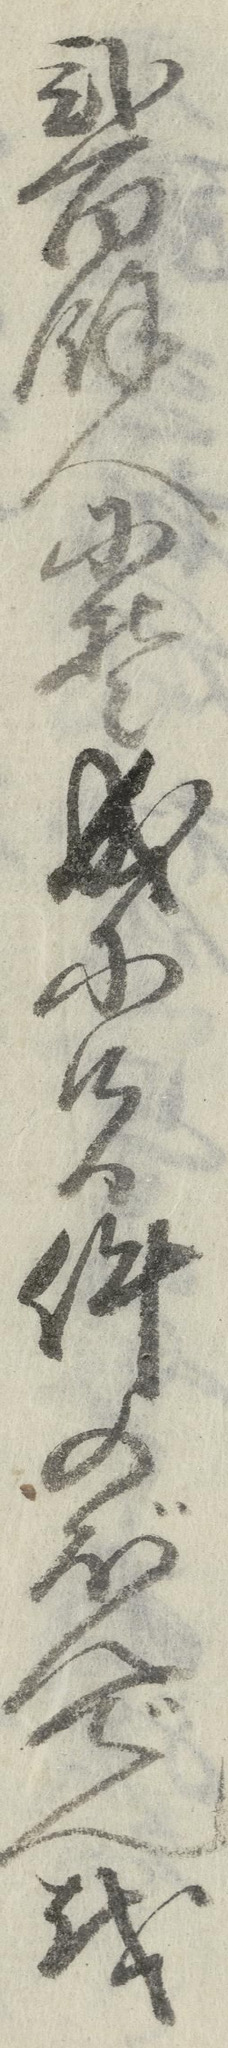弐百餘人にそ成にける件のぼんでんを
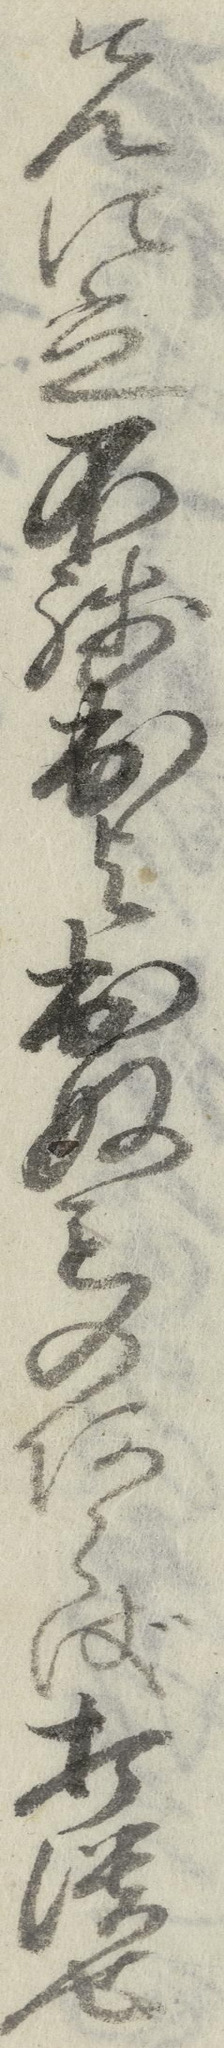先に立不残出よ出ぬものあらば打潰せ
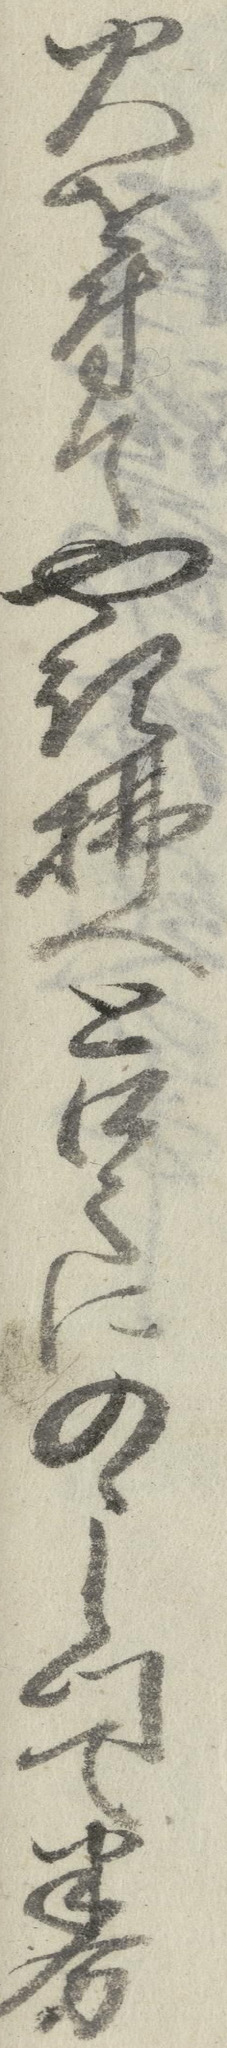火を付てやき払へと口々にのゝしつて半分
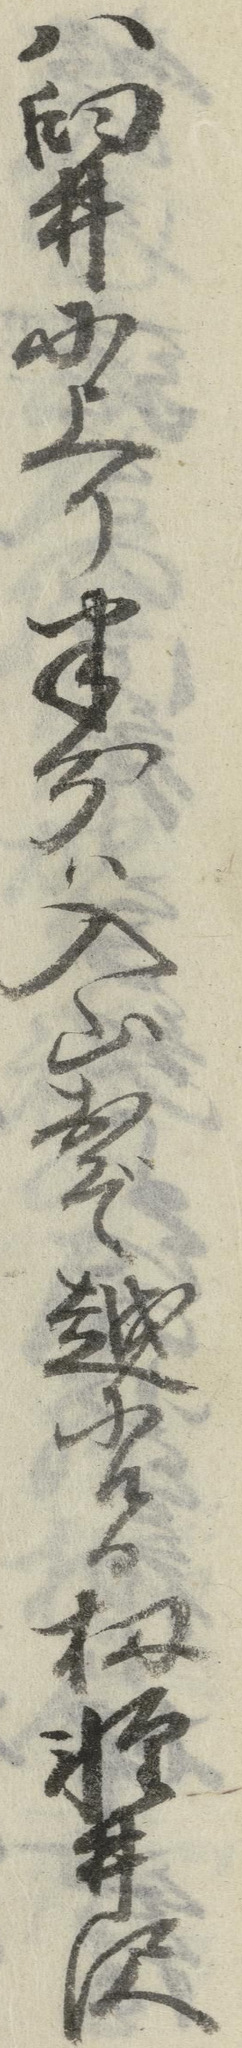は臼井に上り半分は入山出ぞ越にける扨軽井沢
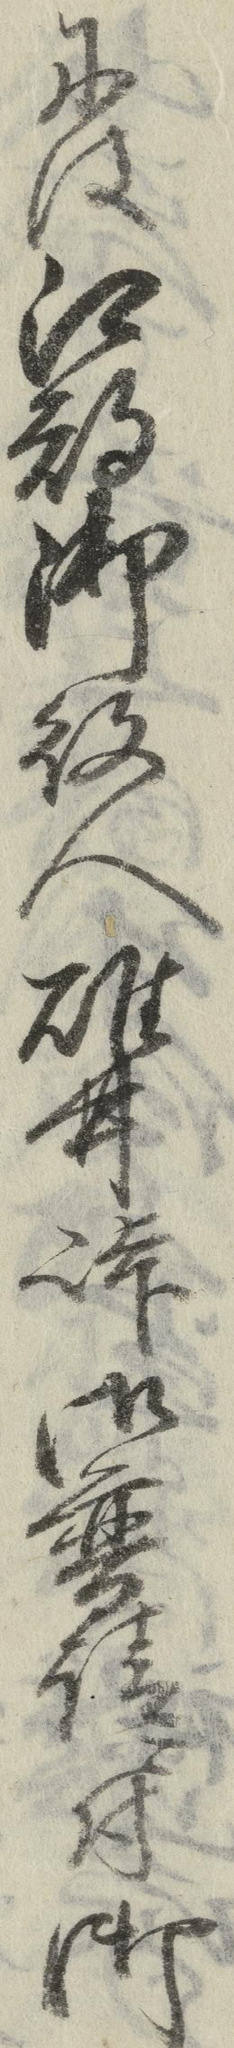には江都御役人碓井峠御普請に付御
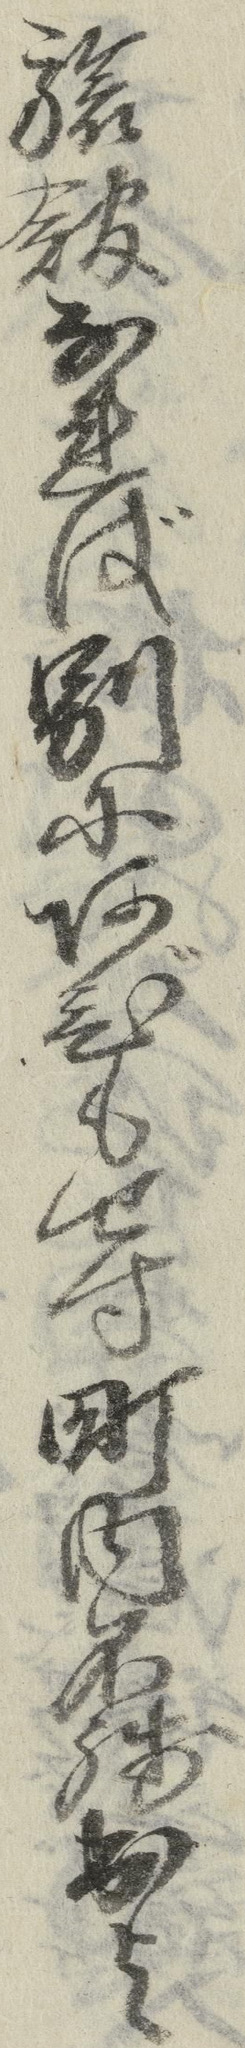旅館なれば別にあびもせす町内不残出よ
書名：浅間大焼騒動記　中
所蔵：東京大学地震研究所図書室 Earthquake Research Institute Library, The University of Tokyo, JAPAN
